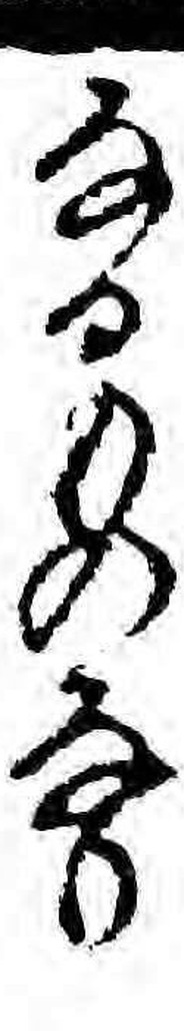なるものなり
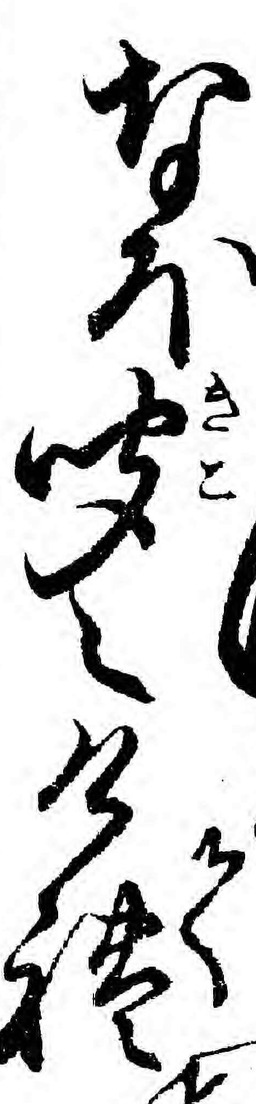なほ聞えけれ

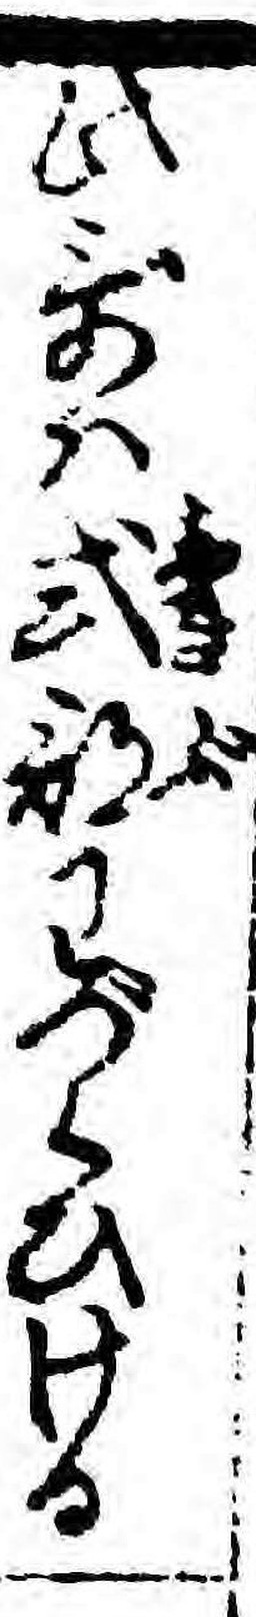此哥は式部わづらひける
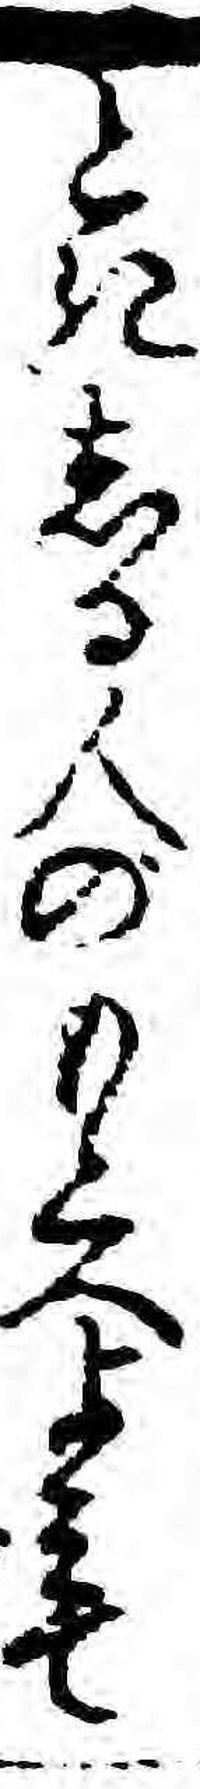ときしる人のもとへよみて
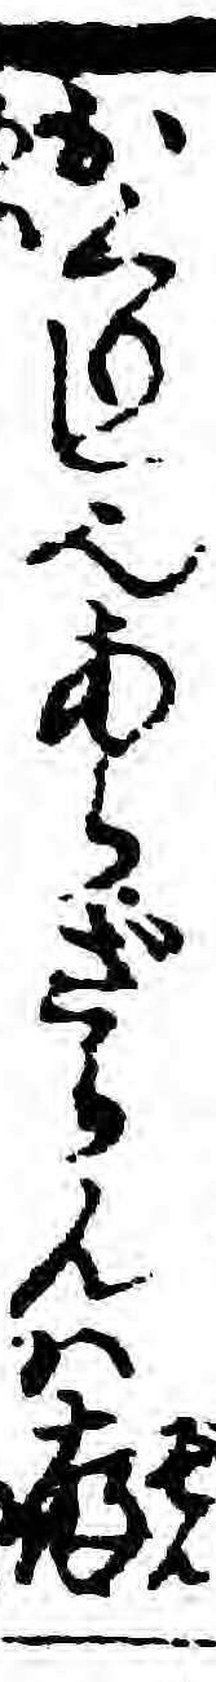おくりし也あらざらんは存
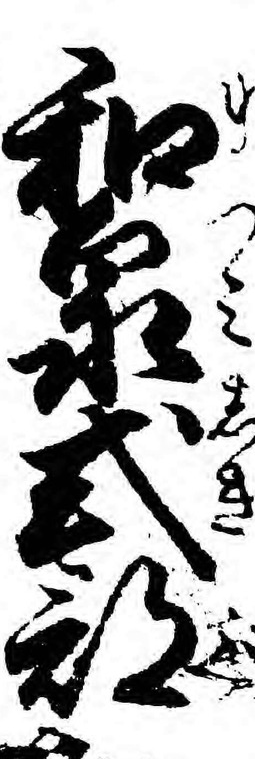和泉式部
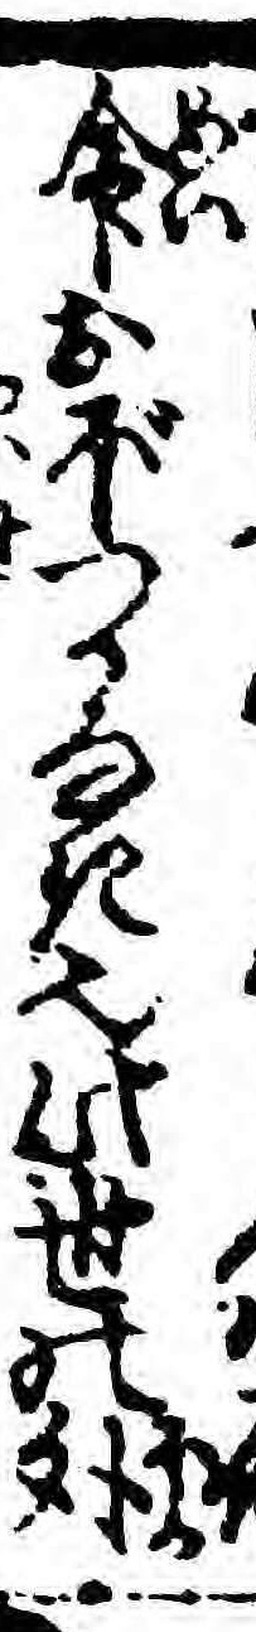命おぼつかなき也此世の外
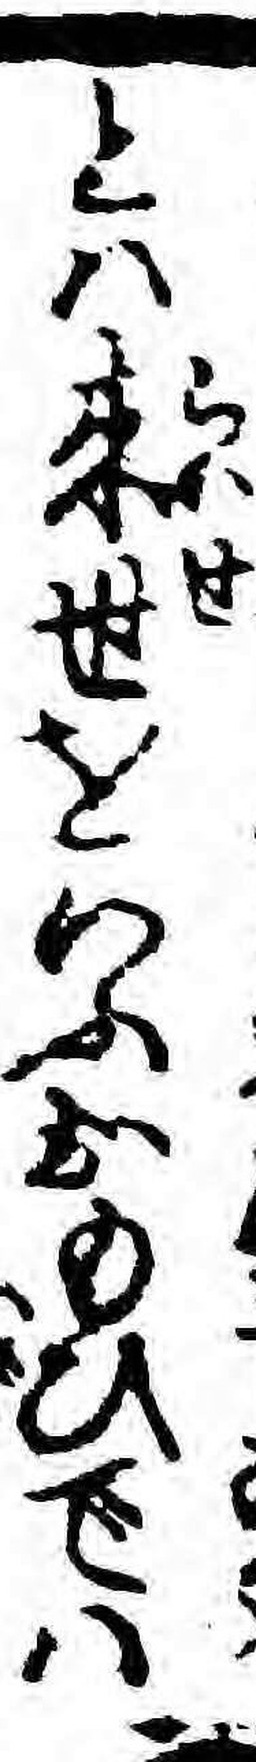とは来世をいふおもひでは
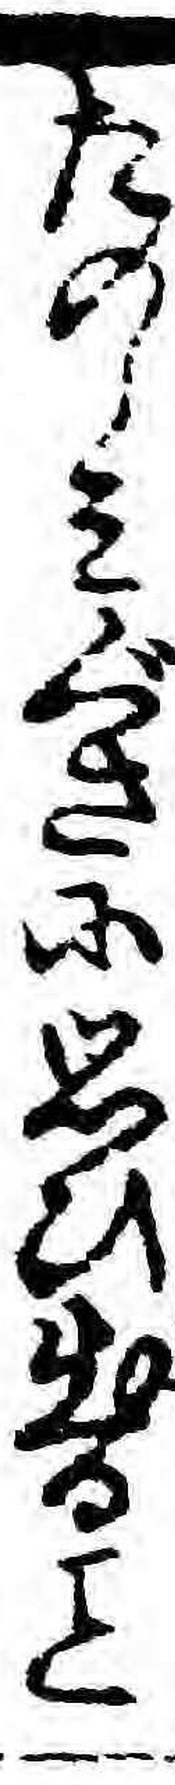たのしみぐさに思ひ出ること
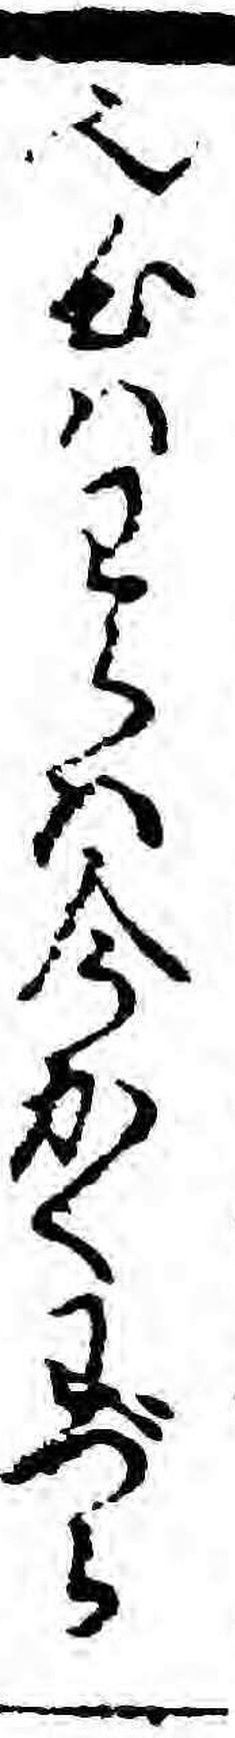也心はわらは今かくわづら
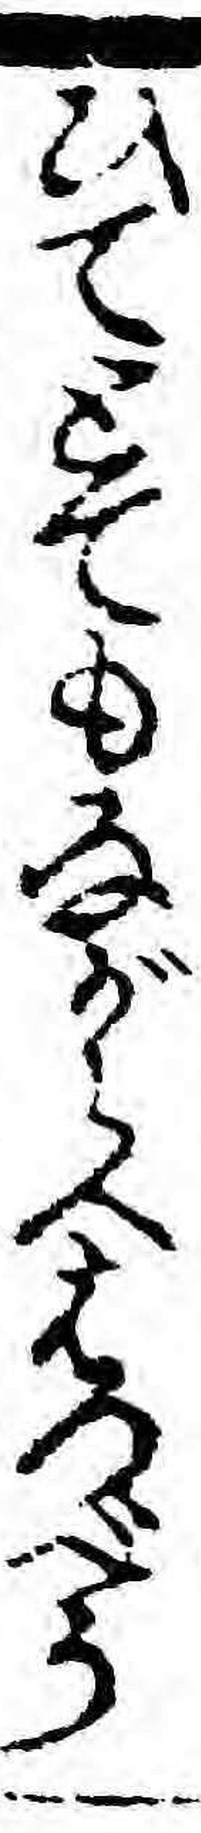ひてとてもながらへはつべう
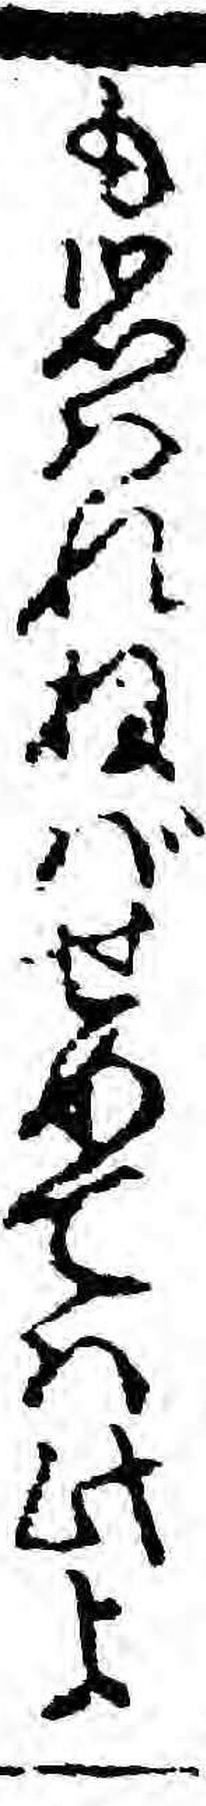も思はれねばせめては此よ
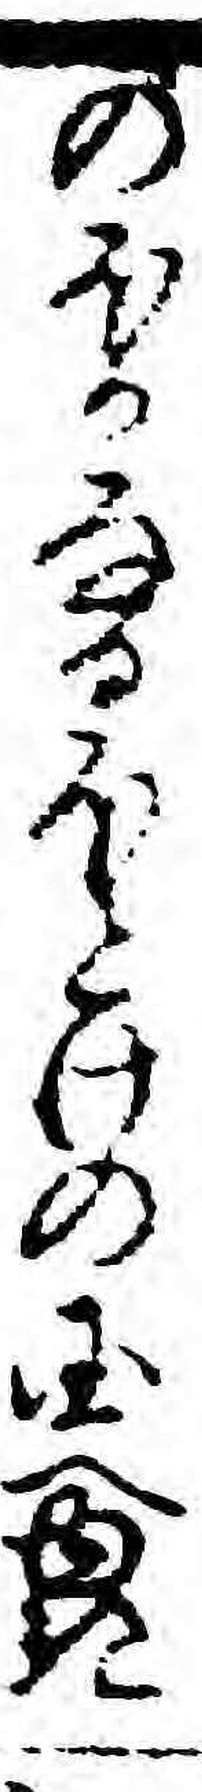のほかなるほとけの国へゆき
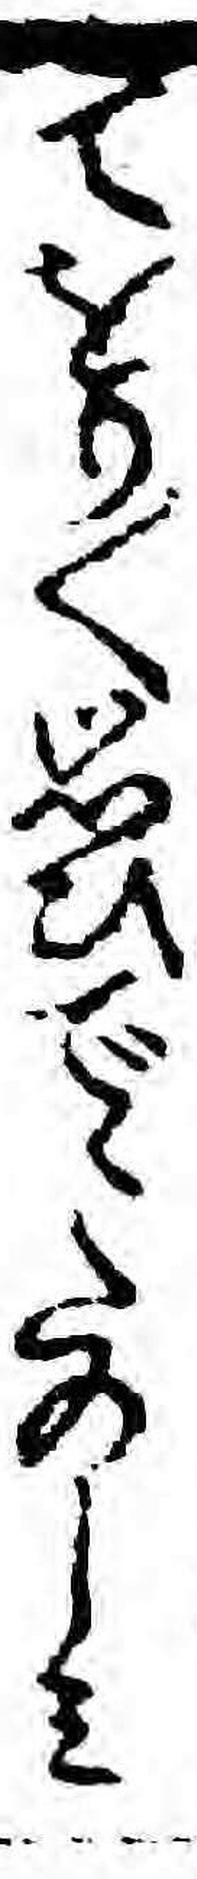てをり〳〵思ひでゝたのしみ
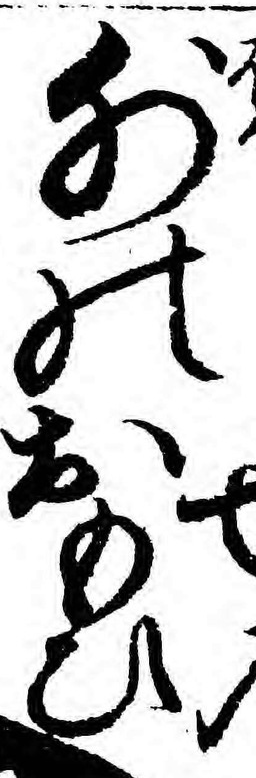外のおもひ
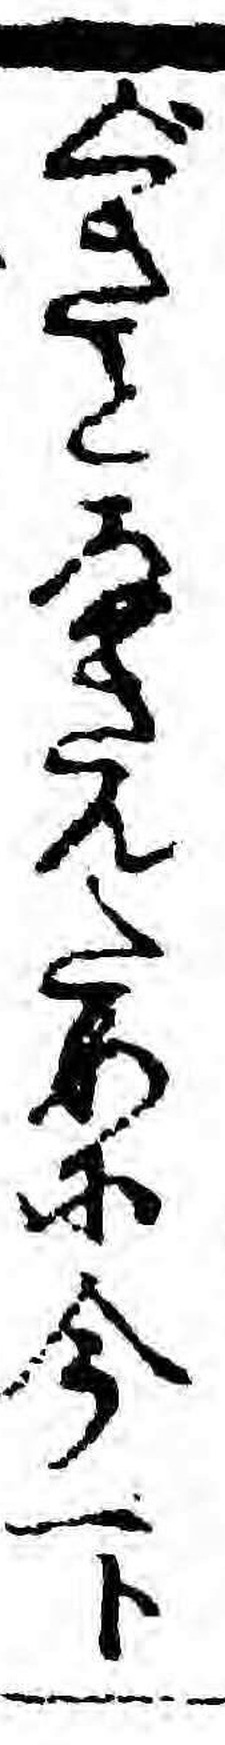ぐさとなさんために今一ト
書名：頭書和歌注譯／壽賀多百人一首小倉錦
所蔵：国文学研究資料館
